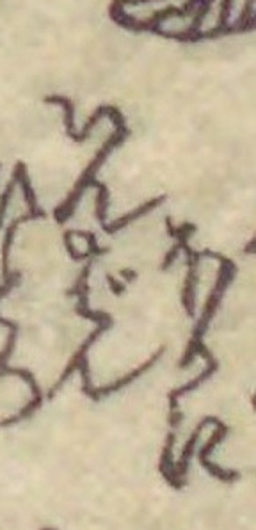いんばん
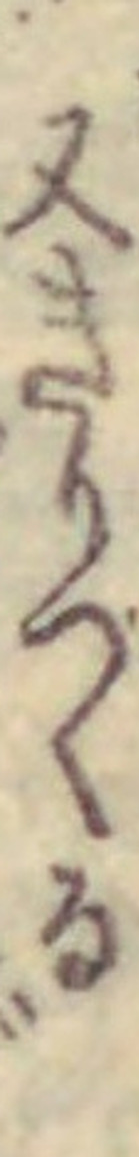又きりつくる
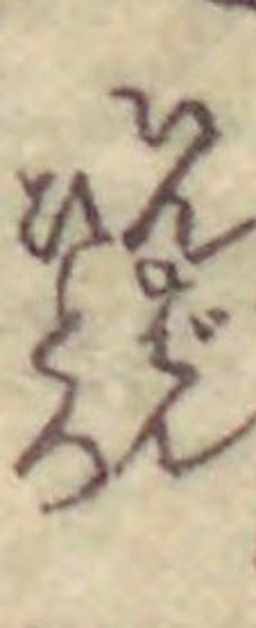ひとつ
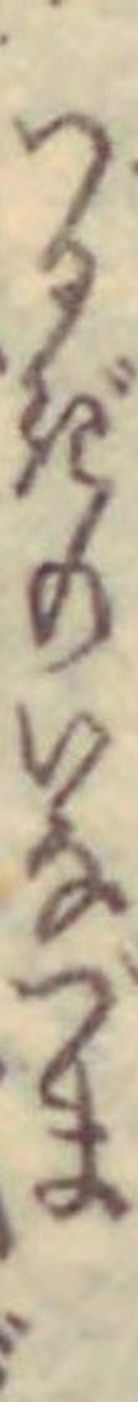つるぎのいなづま
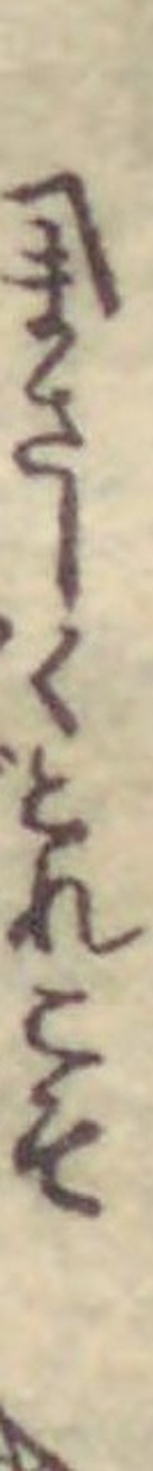〽まさしくこれこそ
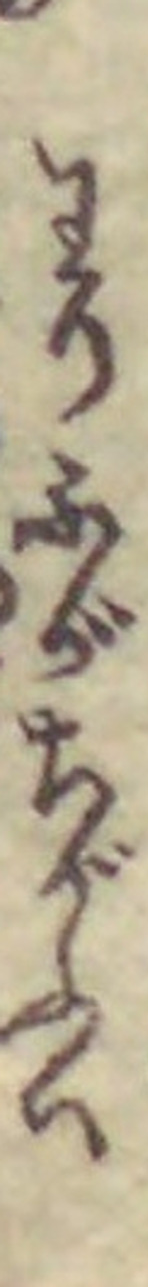わりふがちがふは
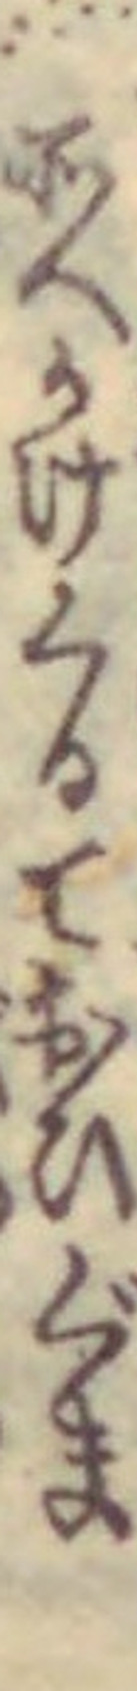所へかけくるておひぐま
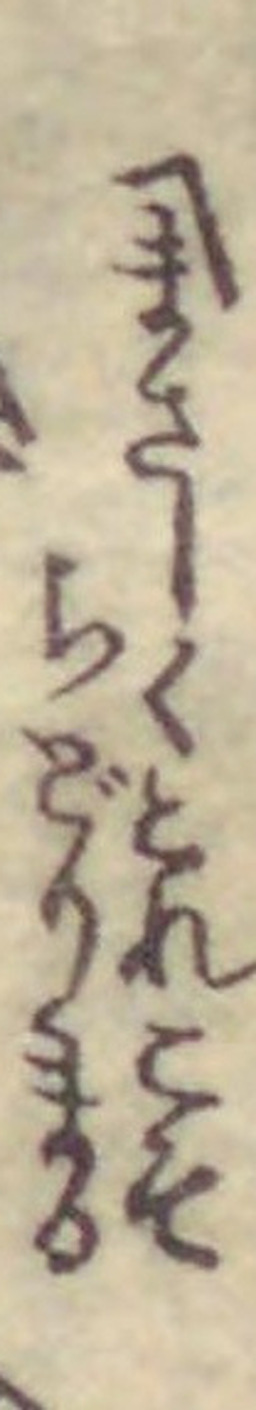ちどりまる
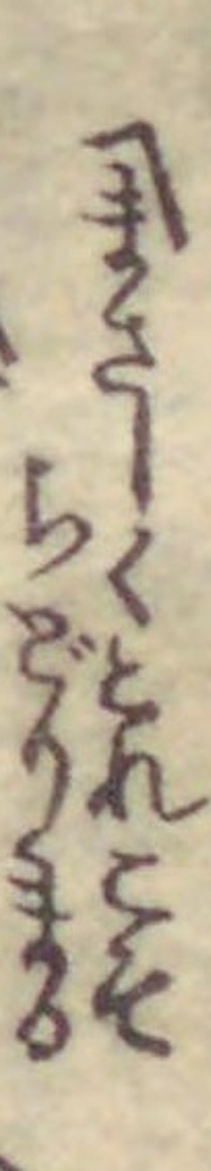〽まさしくこれこそ
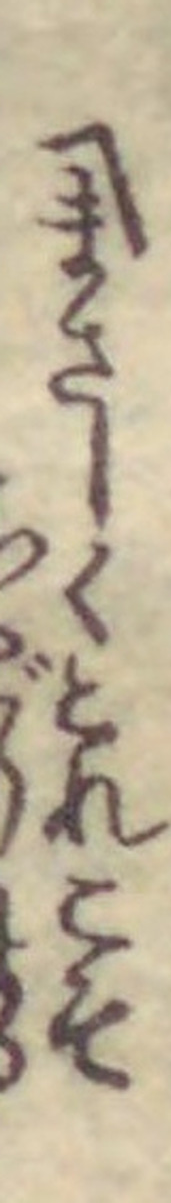〽まさしくこれこそ
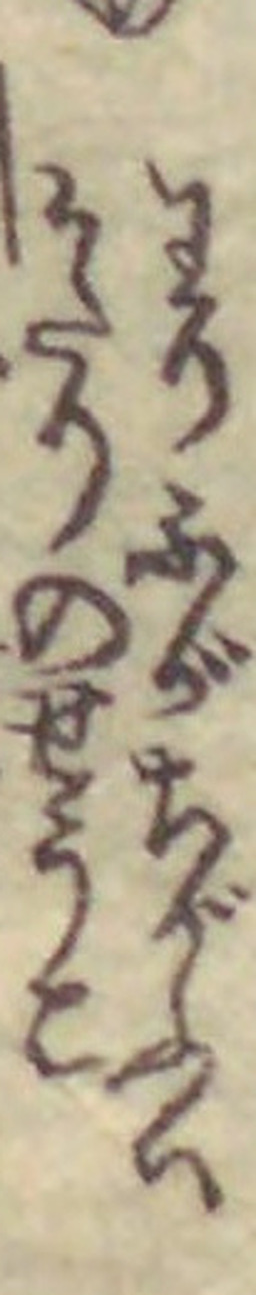かたりのせうこ
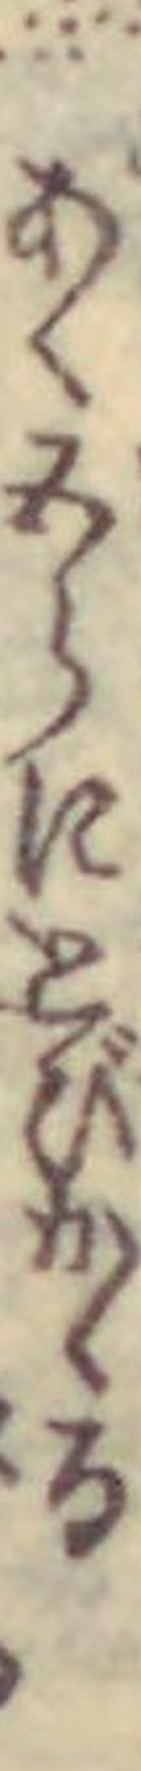あく五郎にとびかゝる
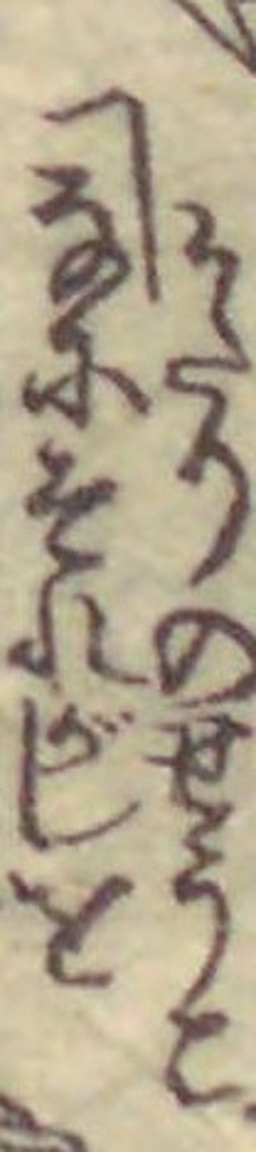〽なにそれがしを
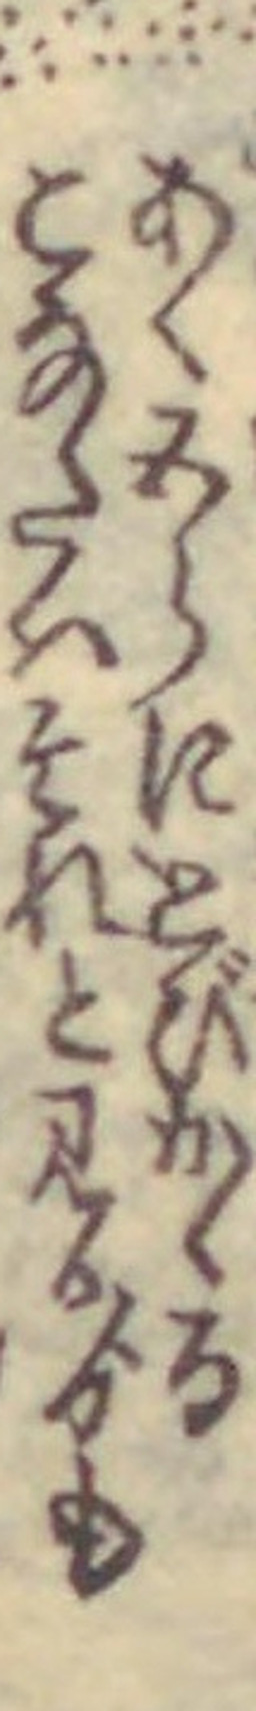こなたはそれと見るよりも
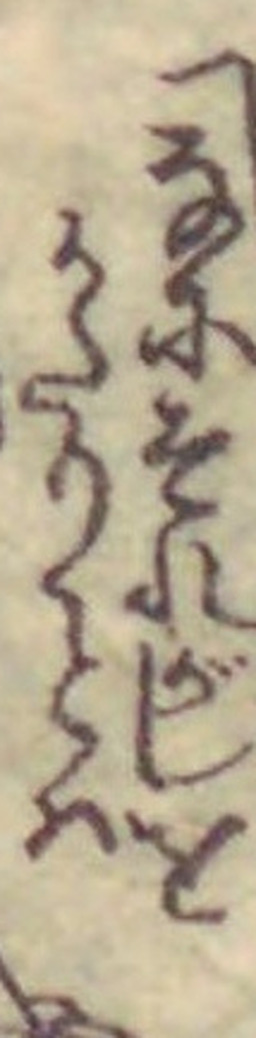かたりとは
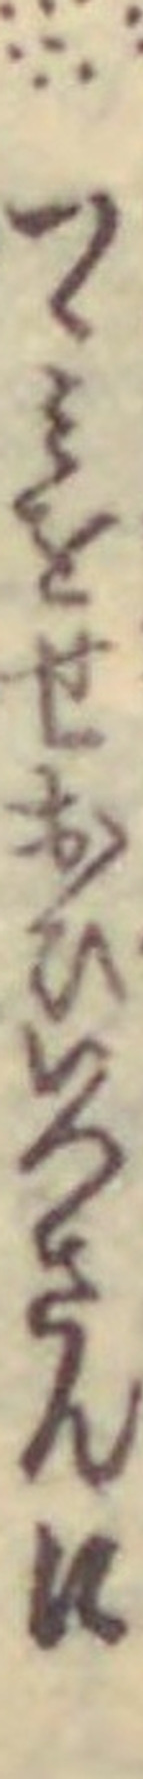つゝみをせおひいつさんに
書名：八ツ目鱣因縁物語 3巻
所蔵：国立国会図書館 National Diet Library, JAPAN
